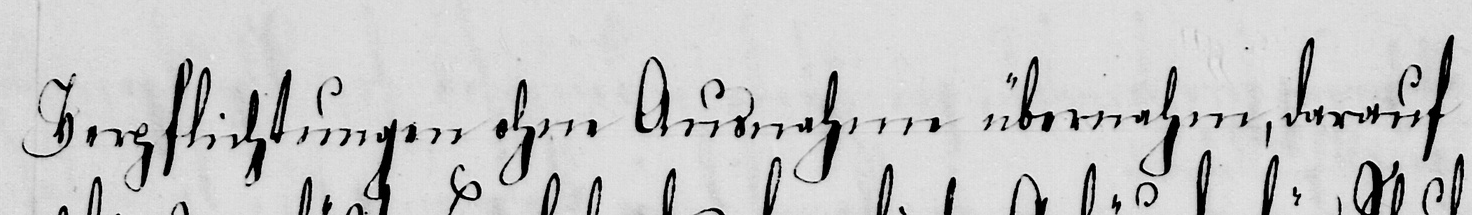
Verpflichtungen ohne Ausnahme übernahm, darauf
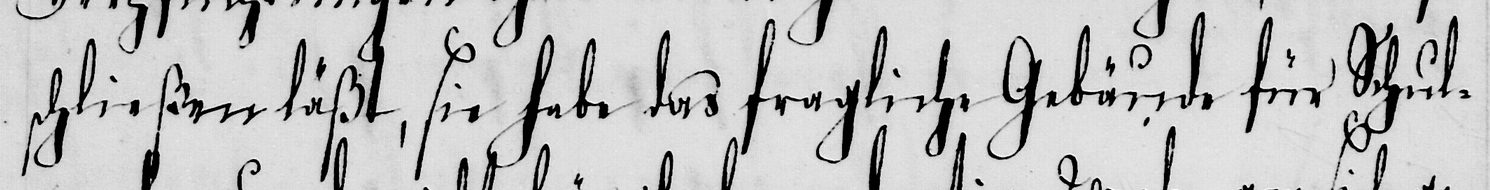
schließen läßt, sie habe das fragliche Gebäude für Schul¬
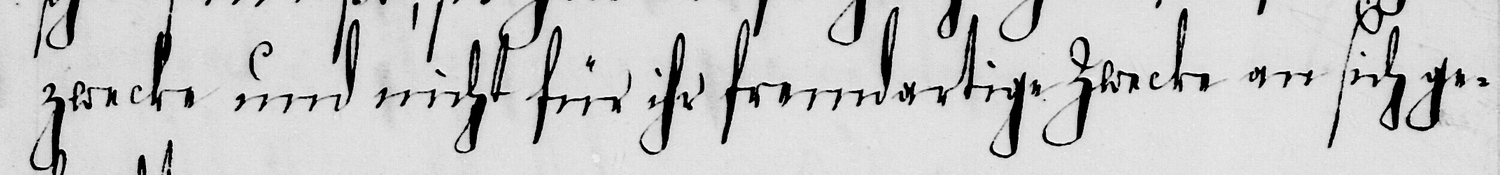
zwecke und nicht für ihr fremdartige Zwecke an sich ge¬
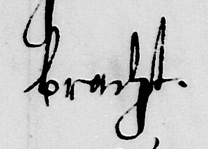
bracht.
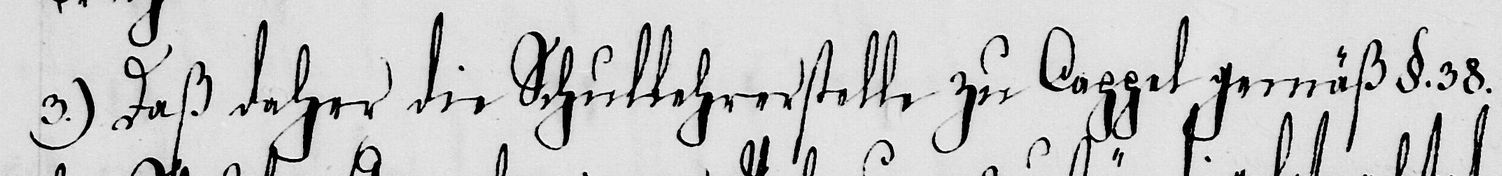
3.) Daß daher die Schullehrerstelle zu Cappel gemäß §. 38.
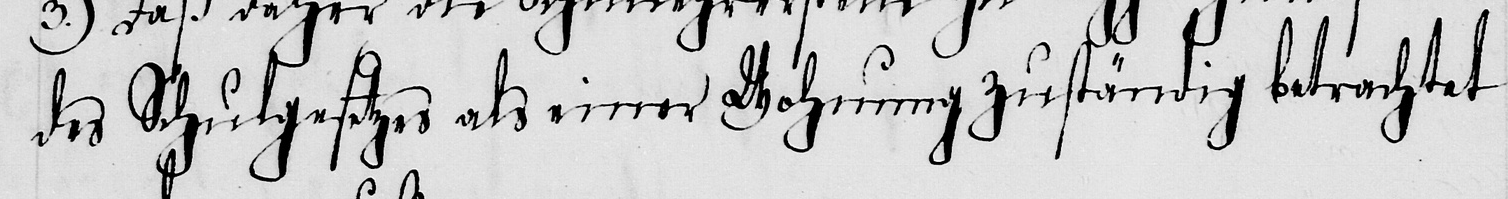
des Schulgesetzes als einer Wohnung zuständig betrachtet
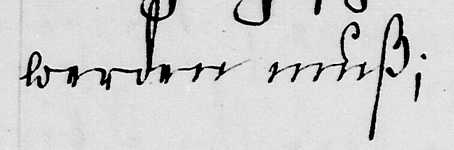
werden muß;
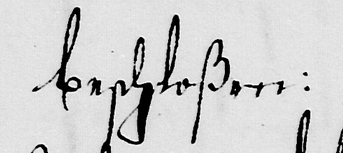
beschloßen:
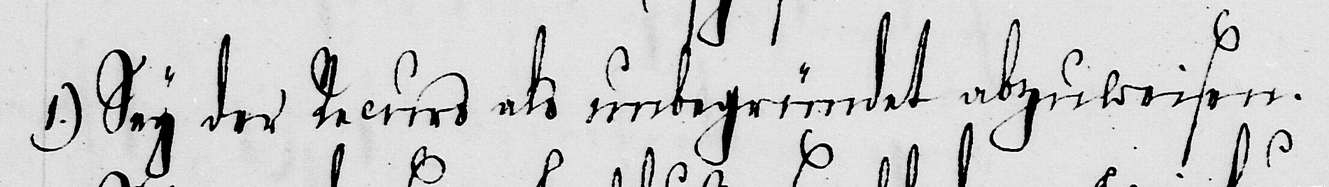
1.) Sey der Recurs als unbegründet abzuweisen.
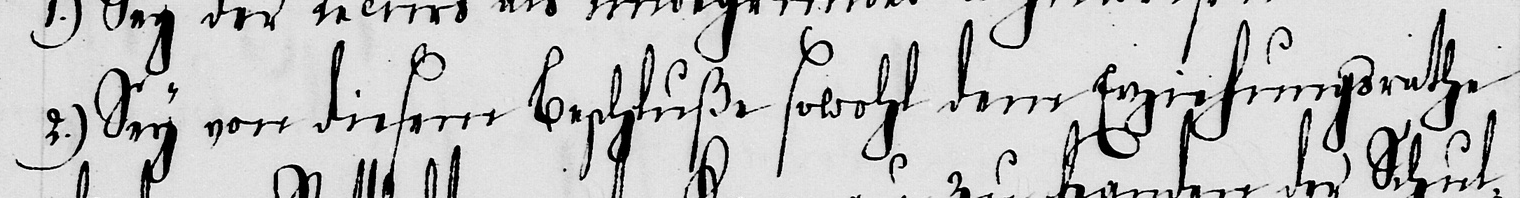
2.) Sey von diesem Beschluße sowohl dem Erziehungsrathe
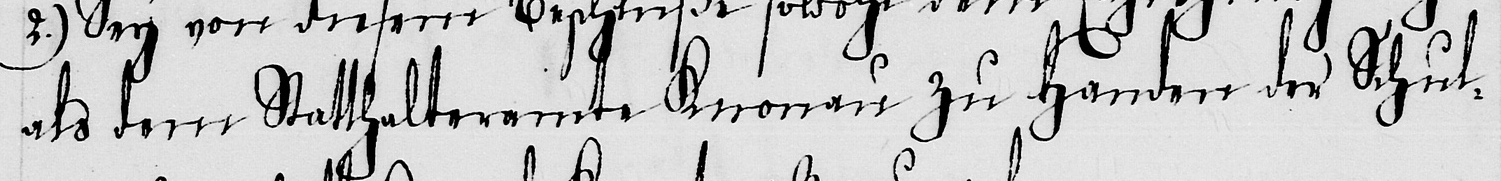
als dem Statthalteramte Knonau zu Handen der Schul¬
